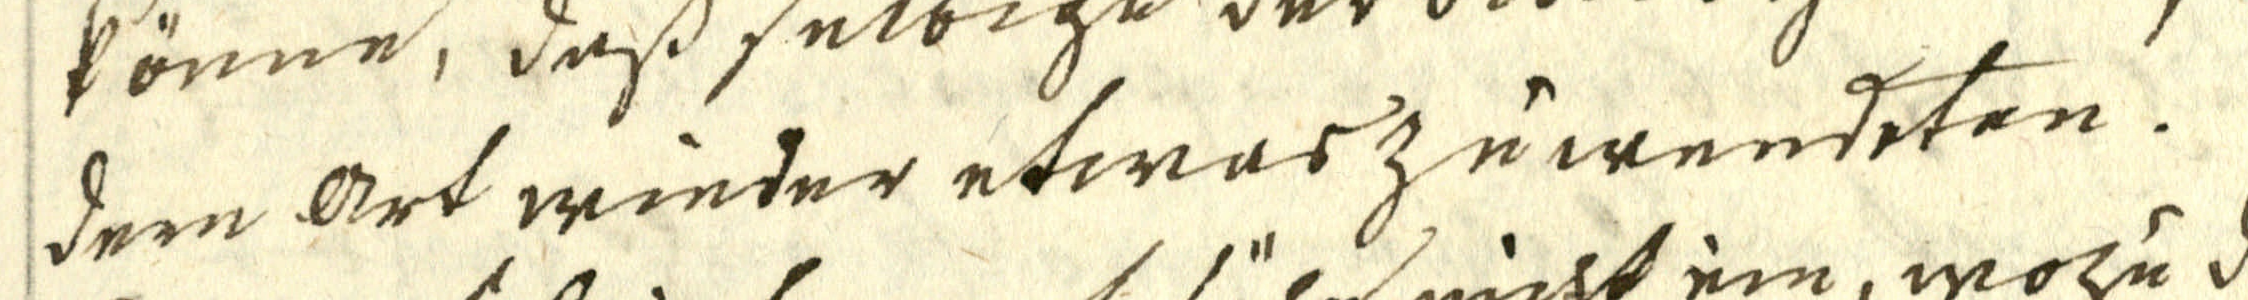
dern Art wieder etwas zu wendeten.
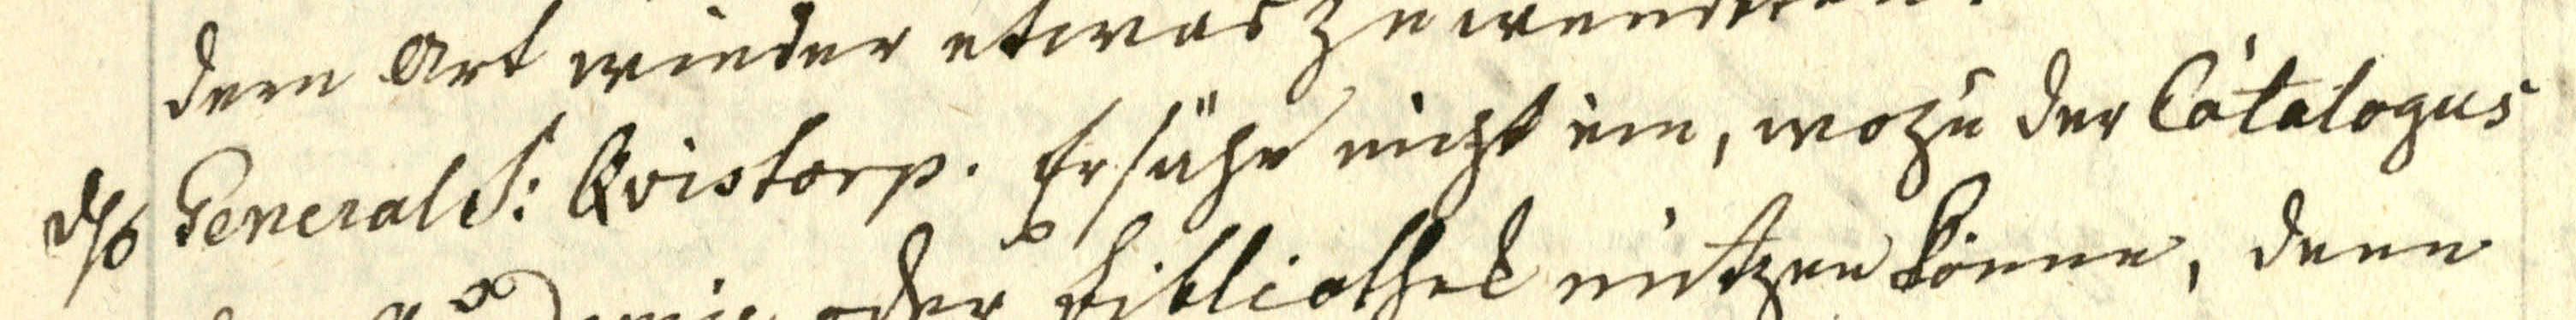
dh General S. Quistorp Er sähe nicht ein, wozu der Catalogus
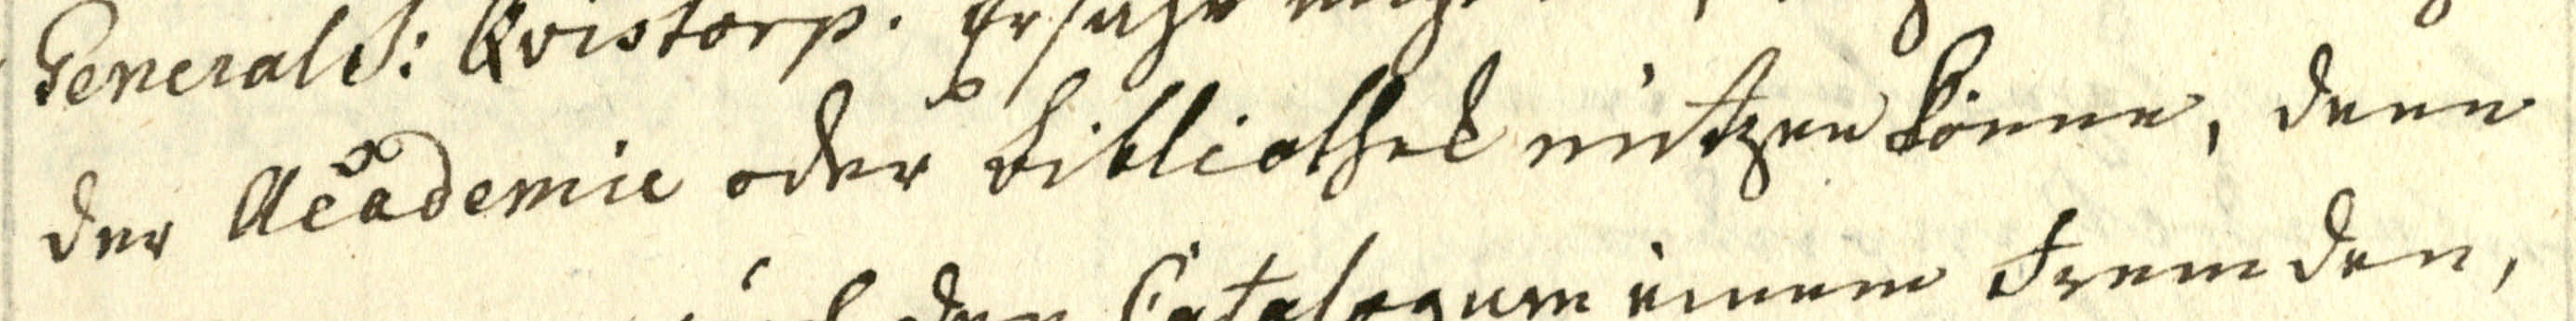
der Academie oder Bibliothek nützen könne, denn
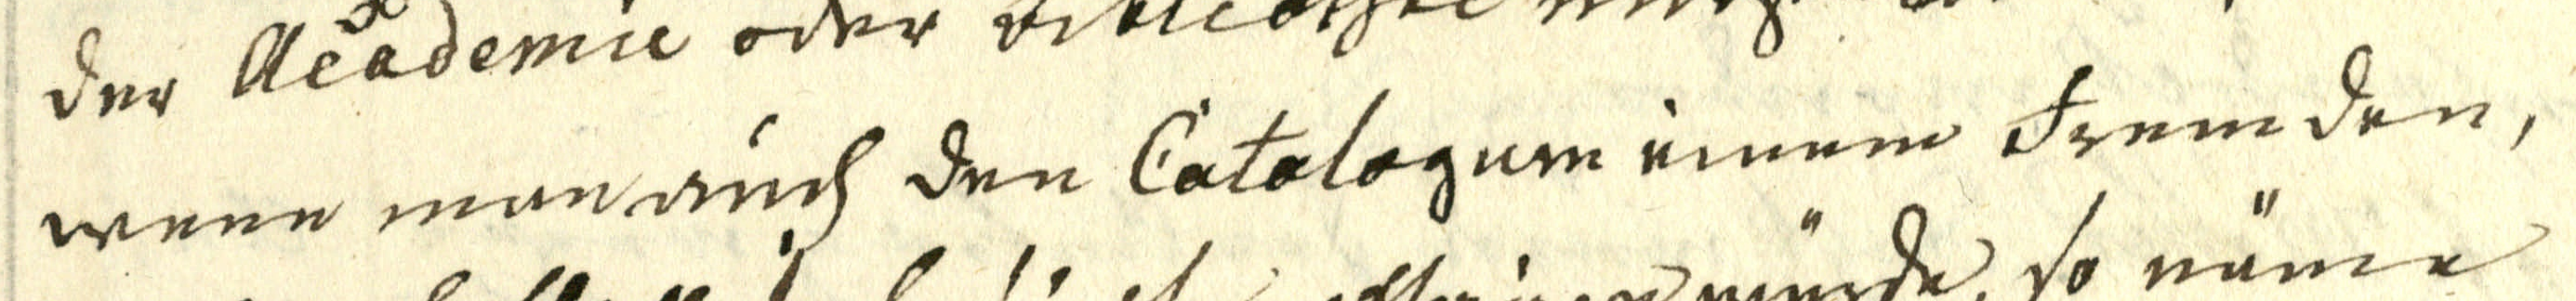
wenn manche den Catalogum einem Fremden,
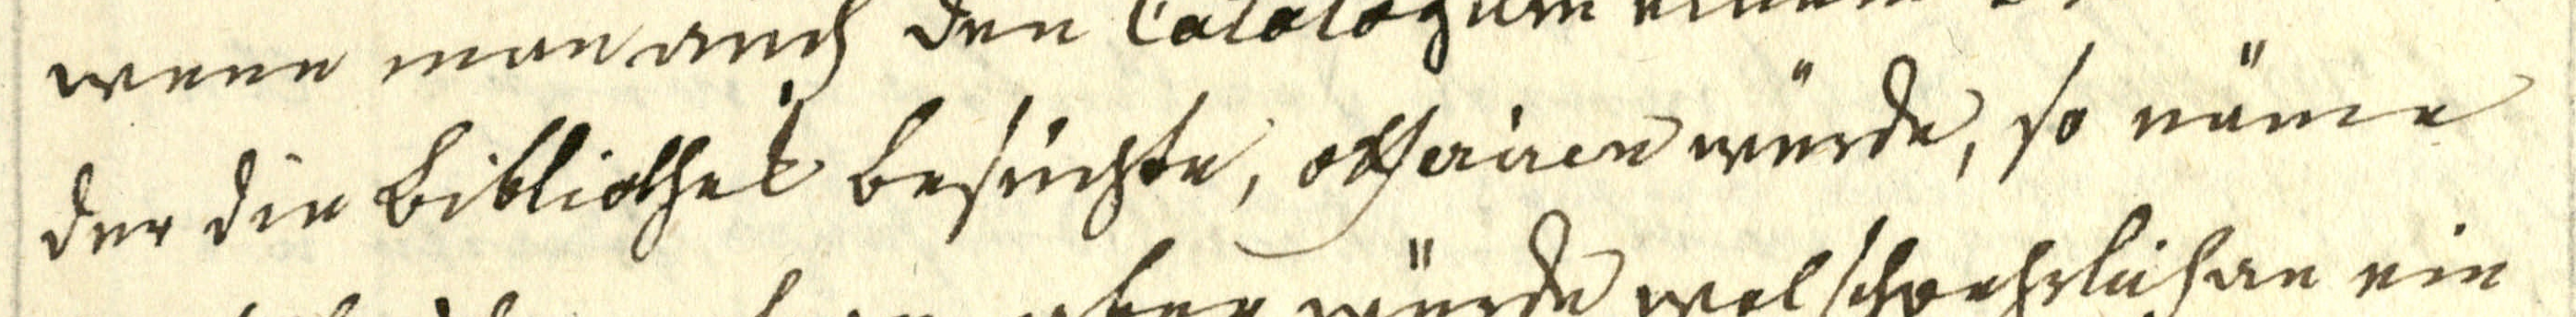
der die Bibliothek besuchten, offeriren würde, so näme
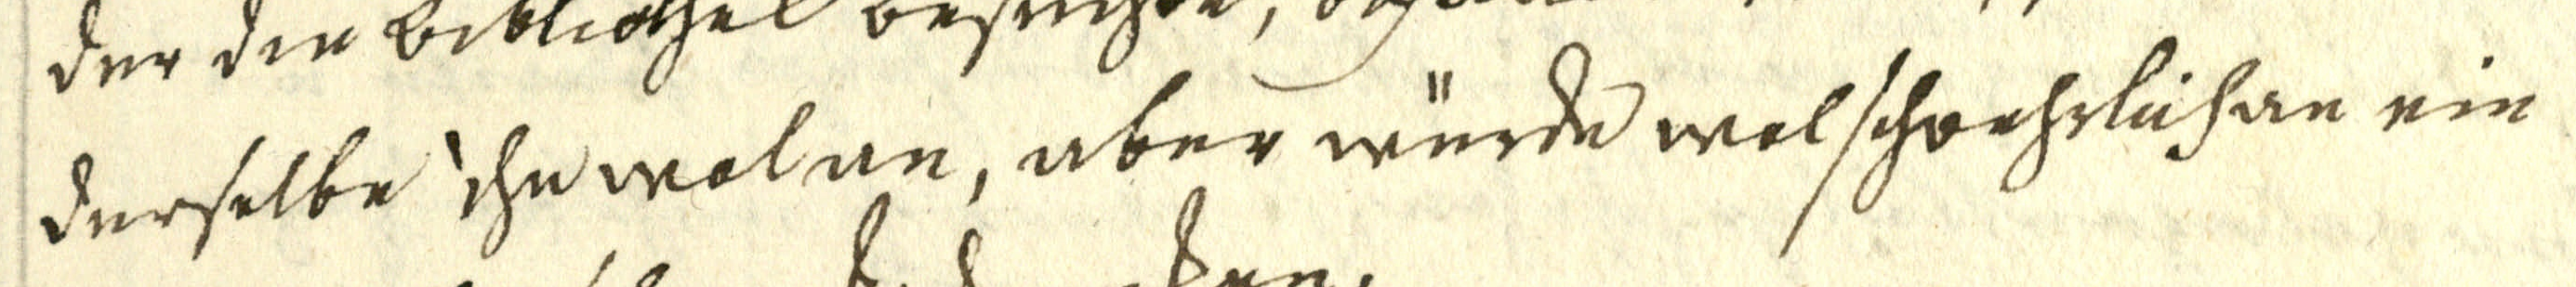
derselbe ihn wol an aber würde wol schwehrlich an ein
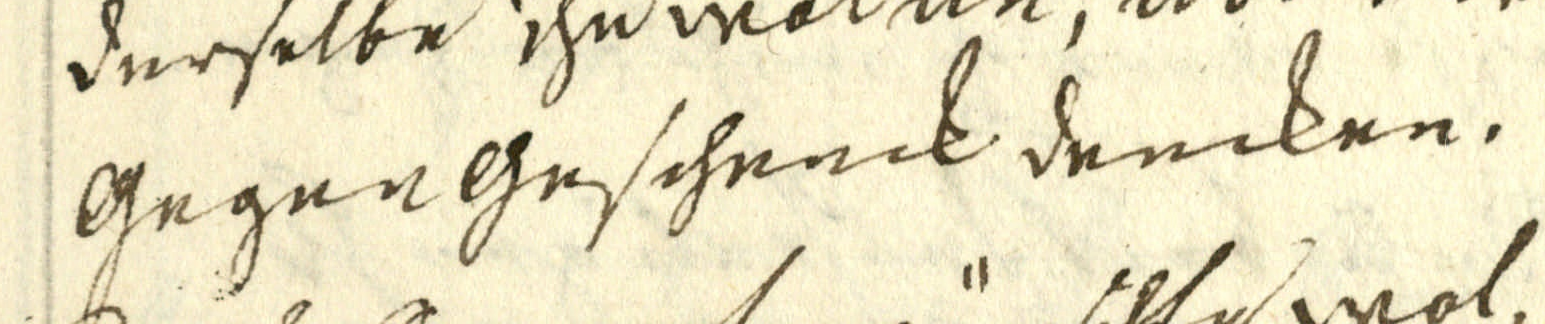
Gegen Geschenck dencken.
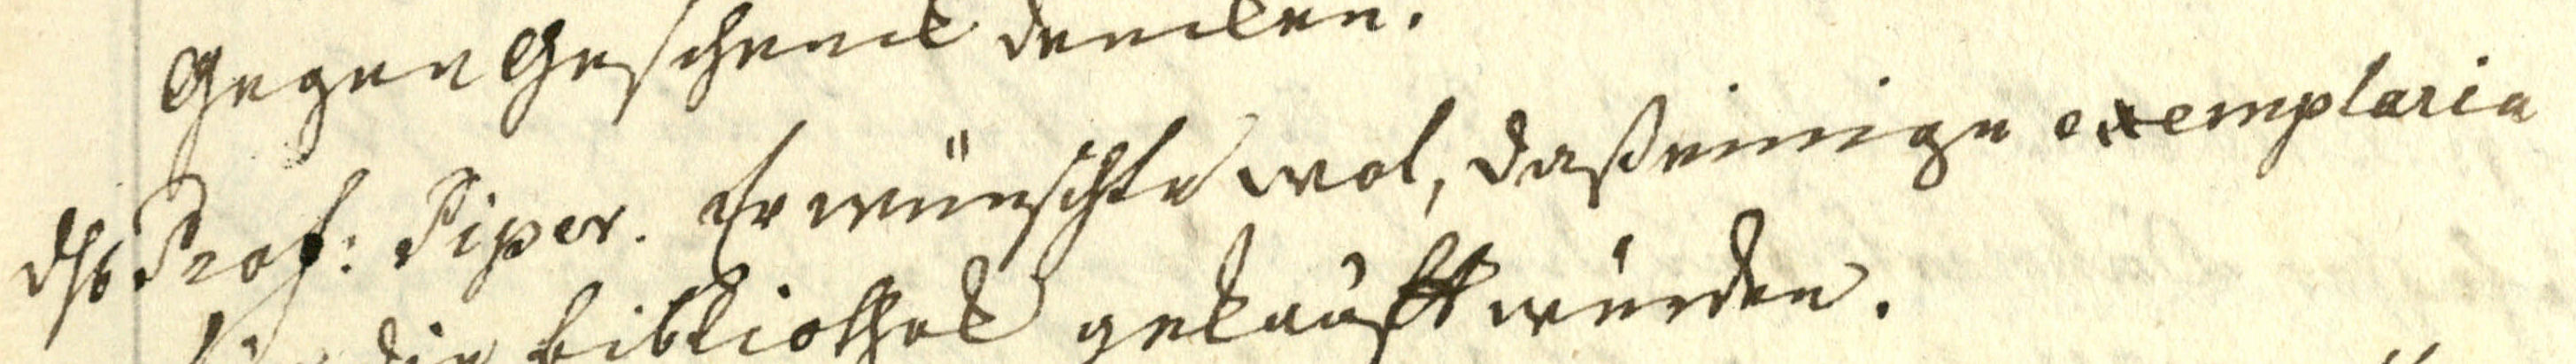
dh Prof. Piper. Er wünschte wol, daß einige exemplaria
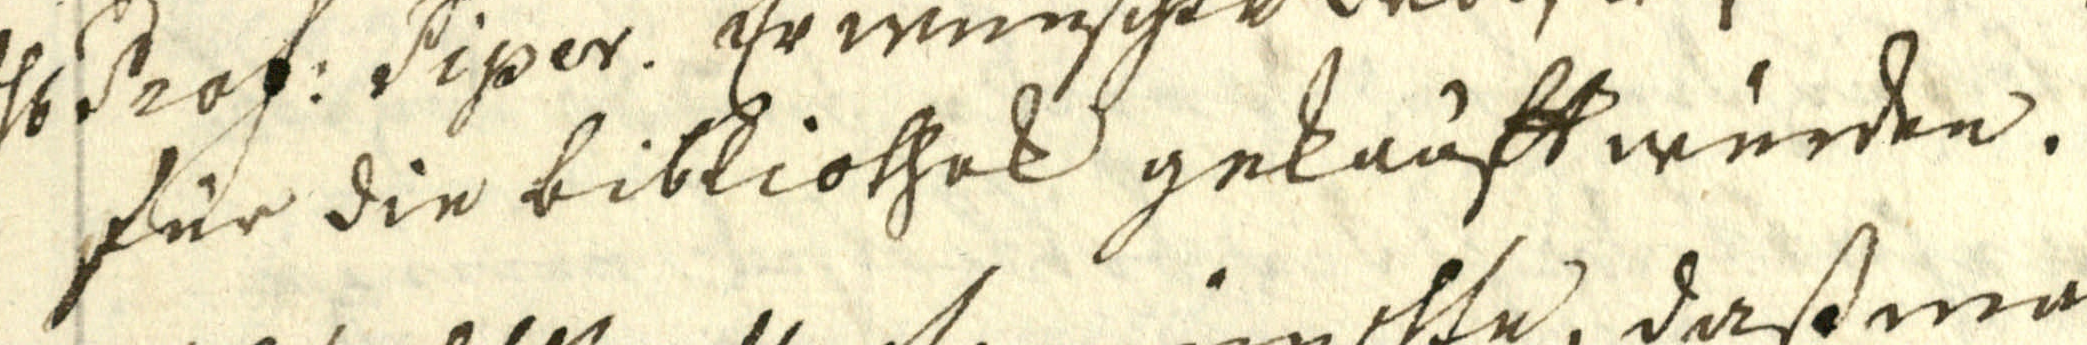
für die Bibliothek gekauft würden.
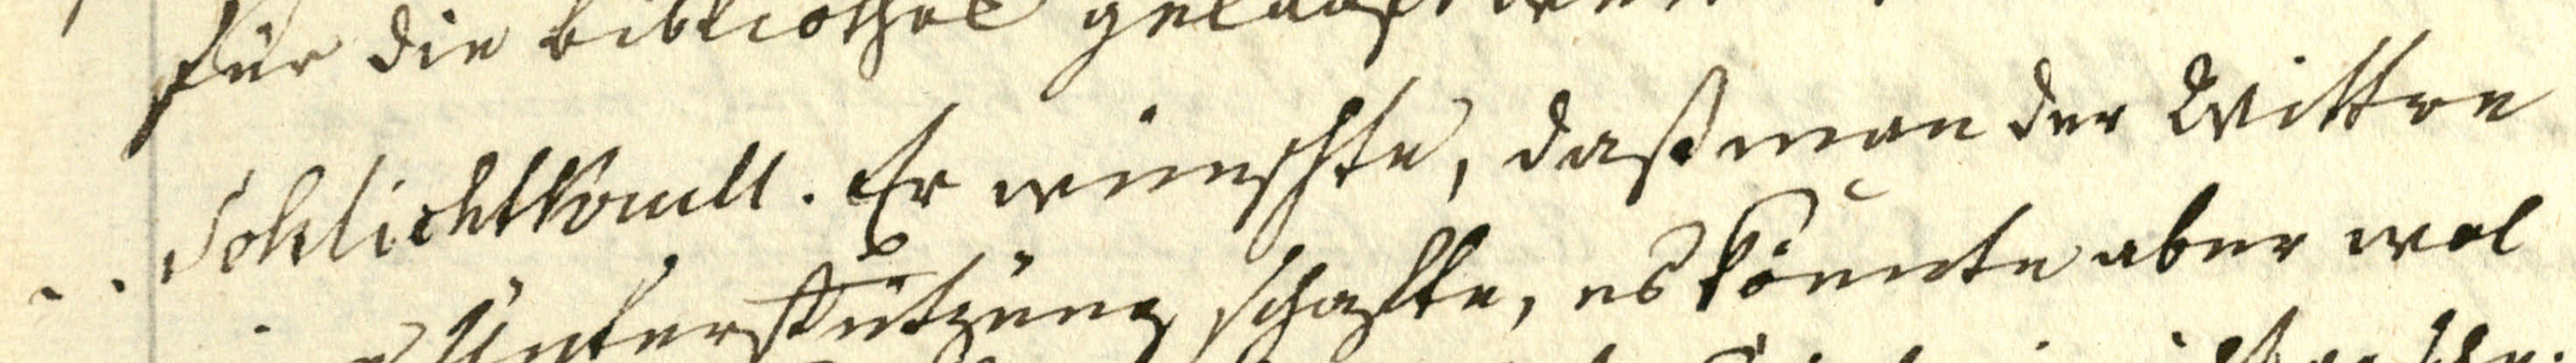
Schlichtkrull. Er wünschte, daß man der Wittwe
